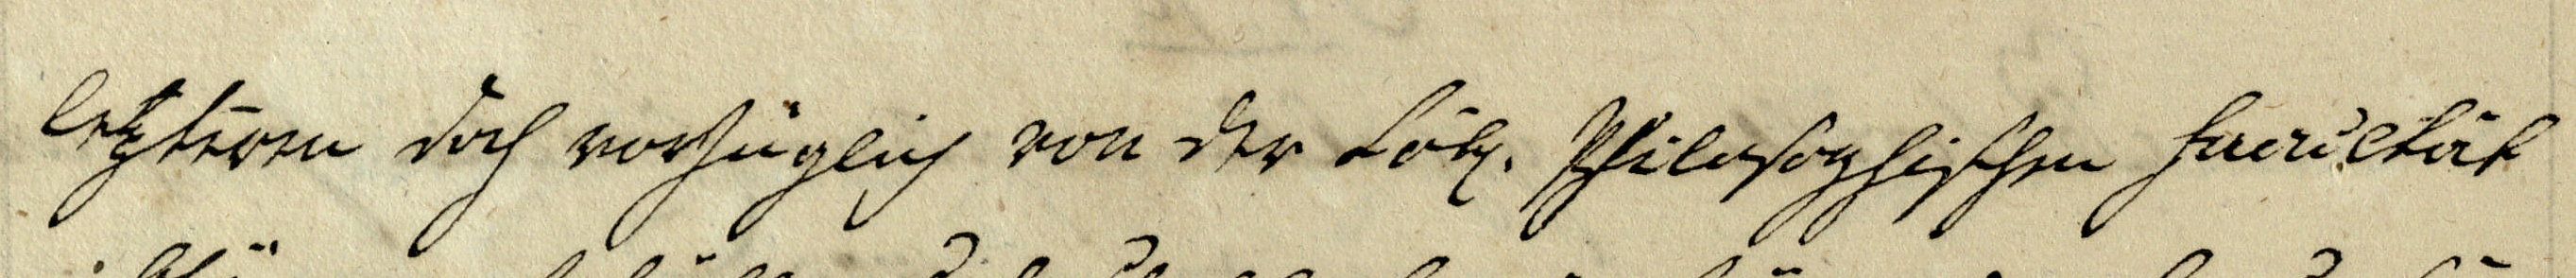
letzteren doch vorzüglich von der Löbl. Philosophischen Facultät
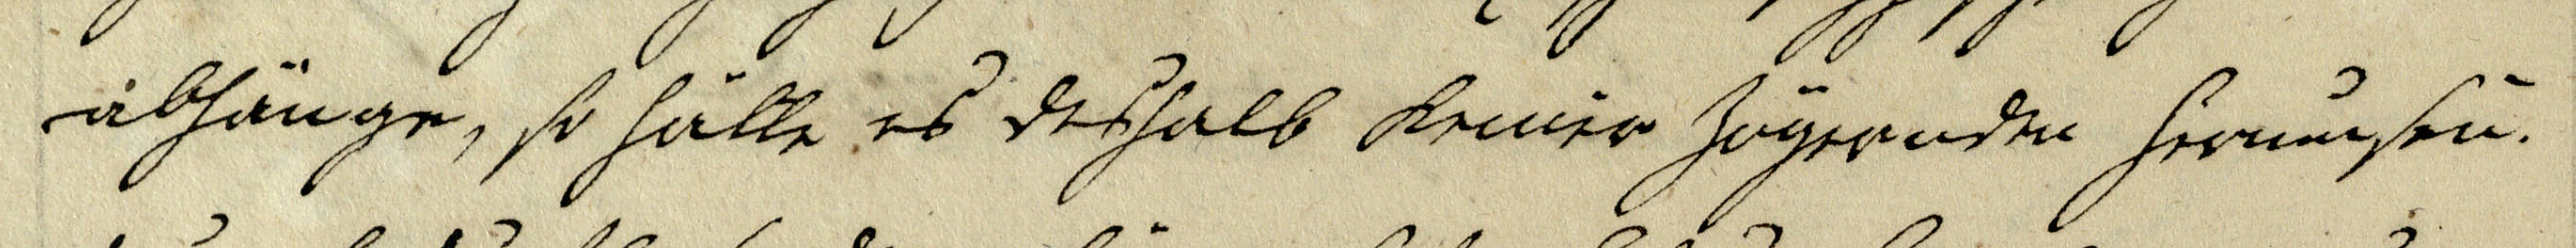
abhänge, so hätte es deshalb keiner zögernden Herumsen¬
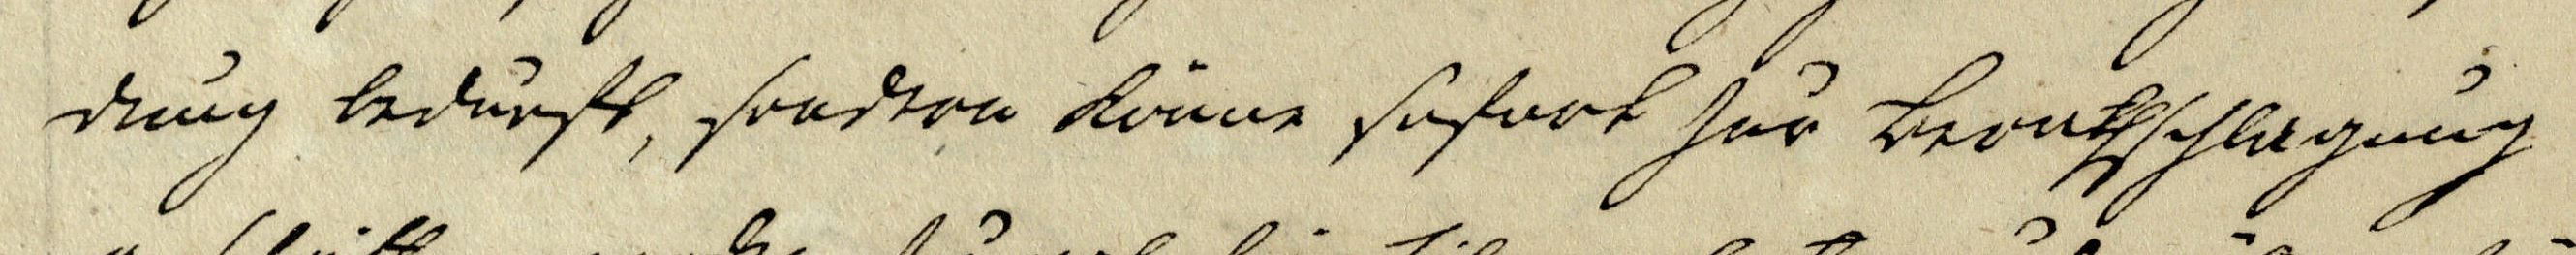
dung bedurft, sondern könne sofort zur Berathschlagung
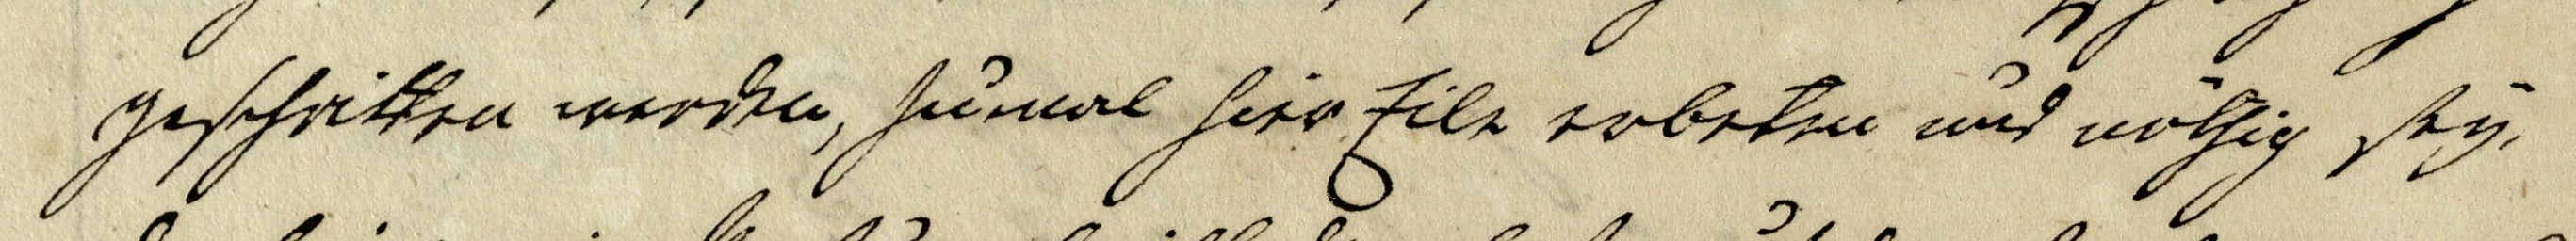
geschritten werden, zumal hier Eile erbeten und nöthig seÿ,
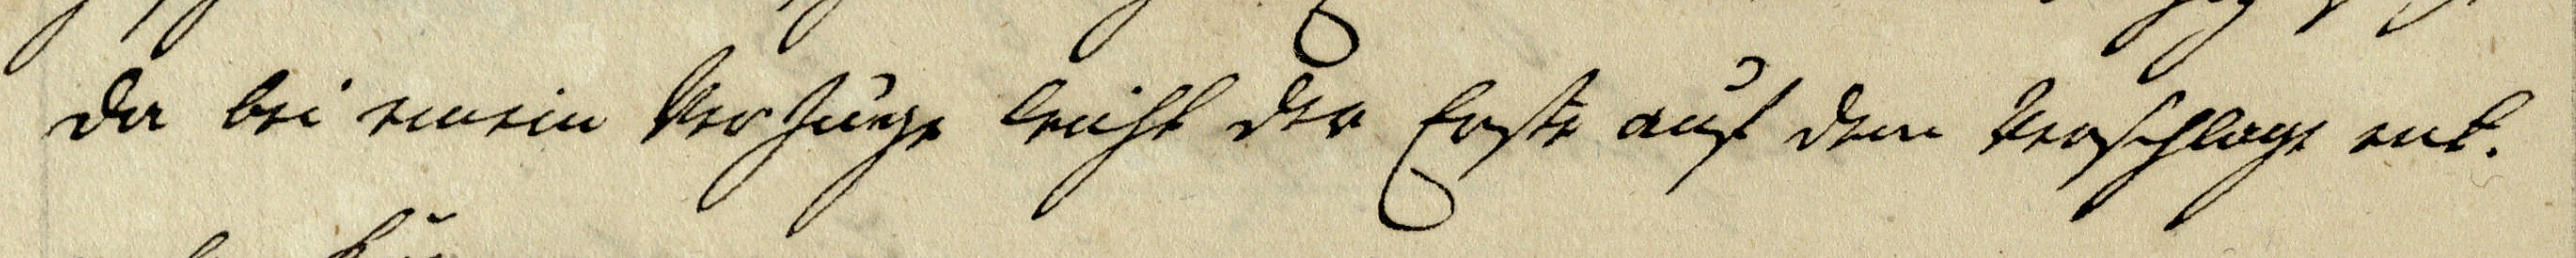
da bei einem Verzuge leicht der Erste auf dem Verschlage ent¬
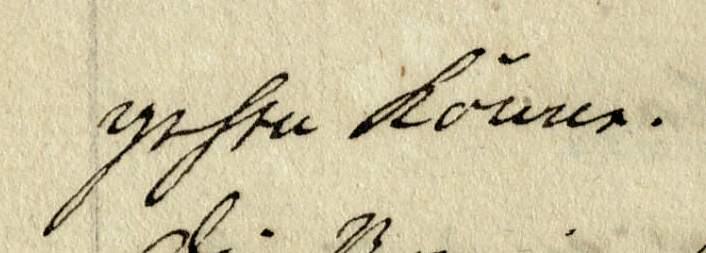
gehen könne.
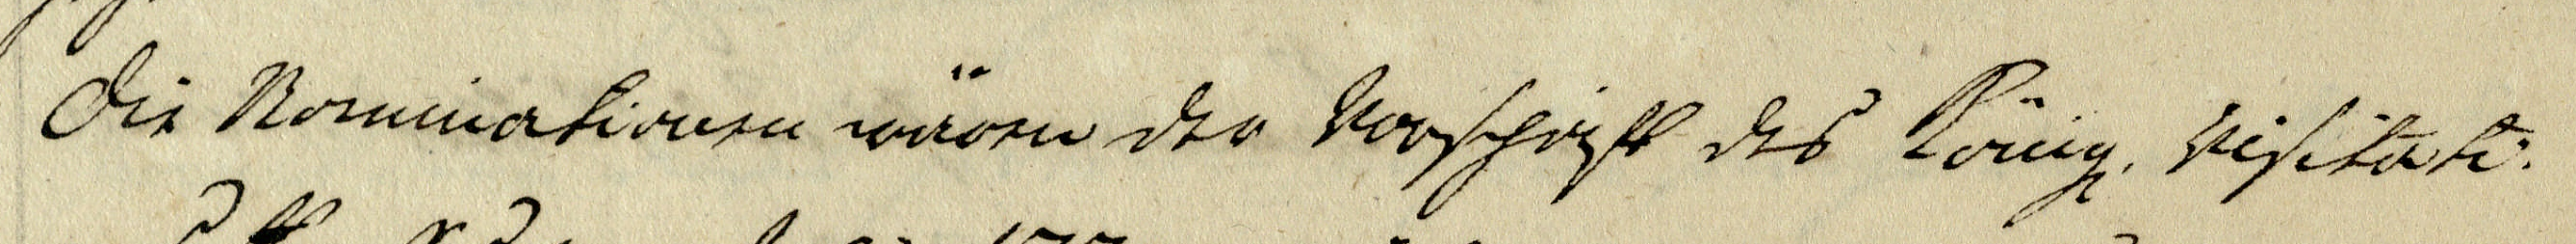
Die Nominationen wären der Vorschrift des König. Visitati¬
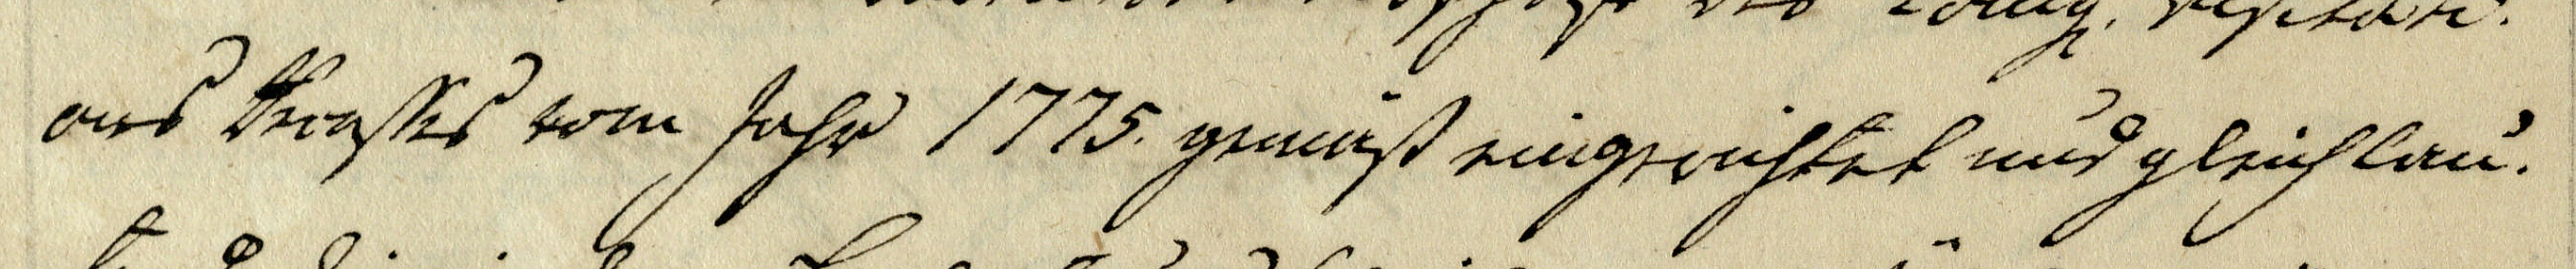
ons Recesses vom Jahr 1775 gemäß eingerichtet und gleichlau¬
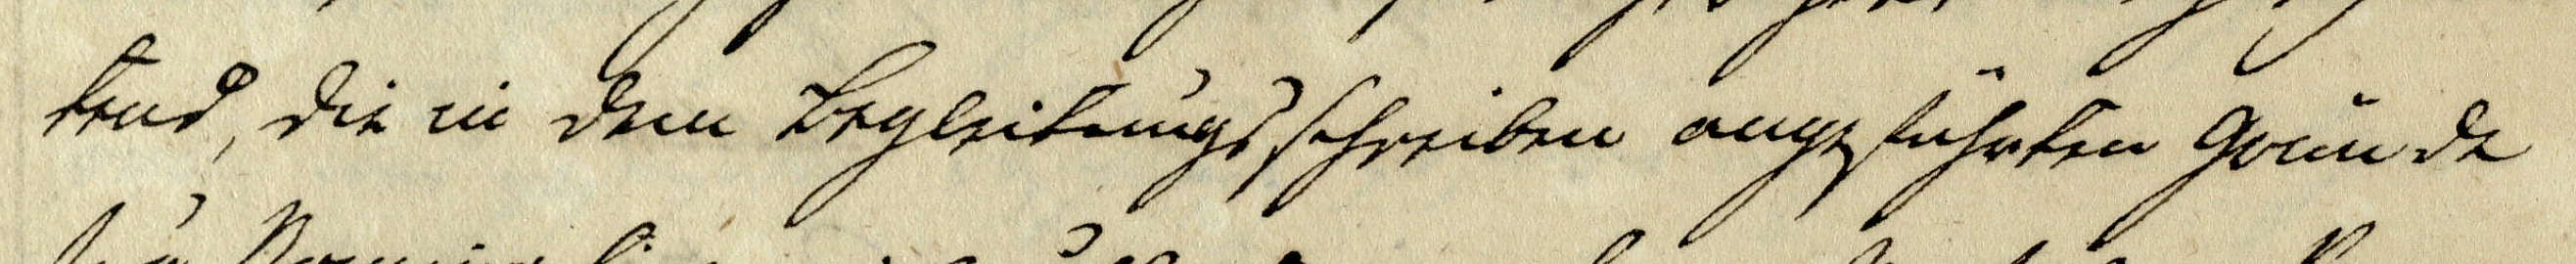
tend, die in dem Begleitungsschreiben angeführten Gründe
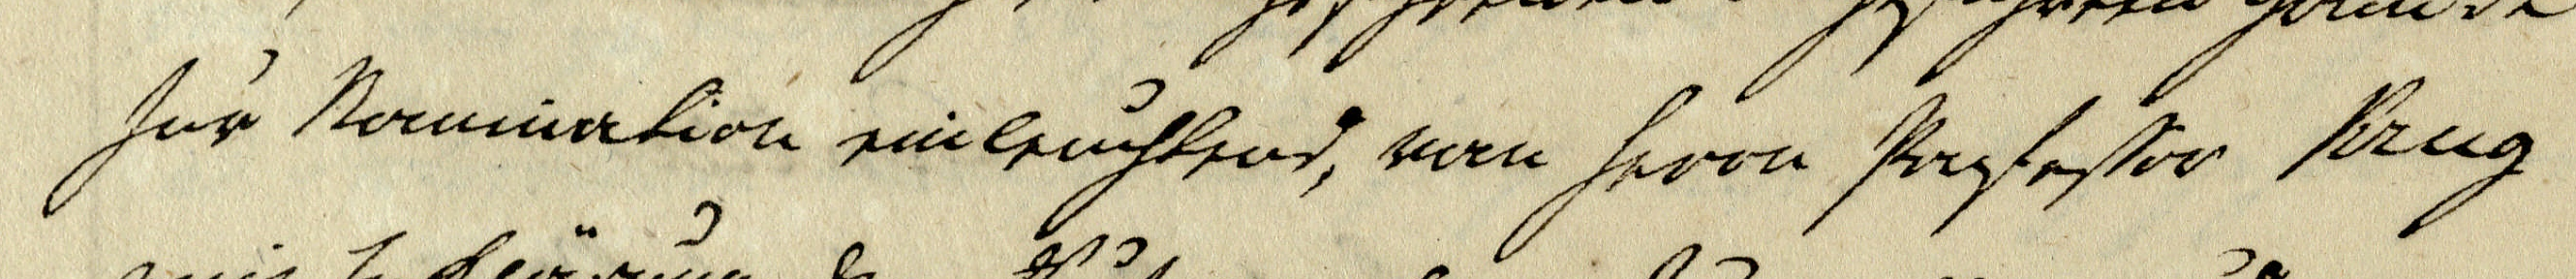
zur Nomination einleuchtend, vom Herrn Professor Krug
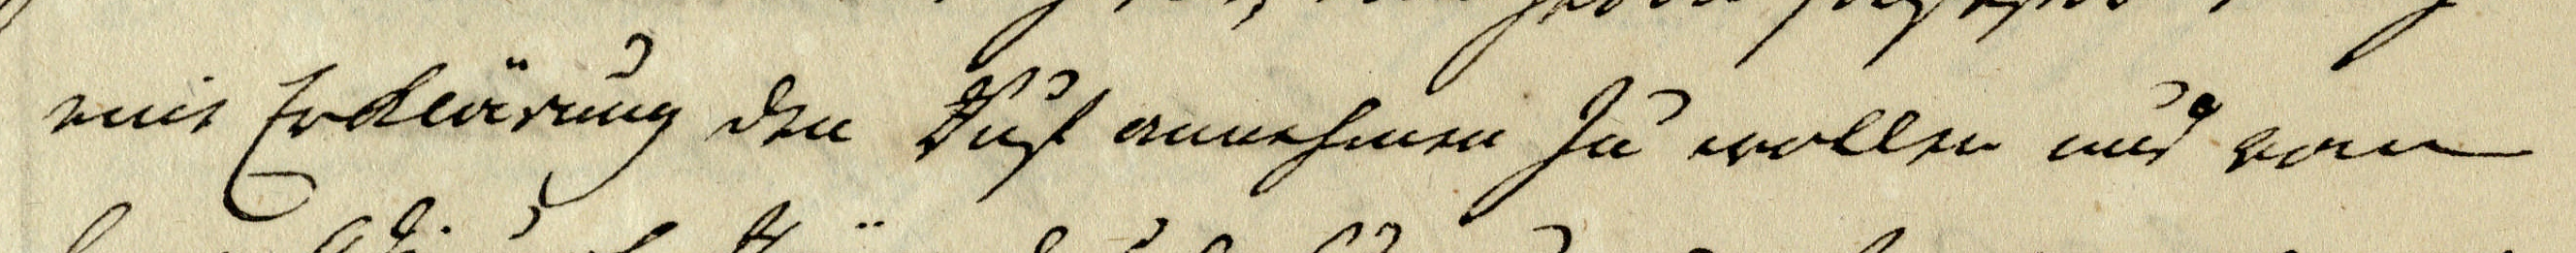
eine Erklärung den Ruf annehmen zu wollen und vom
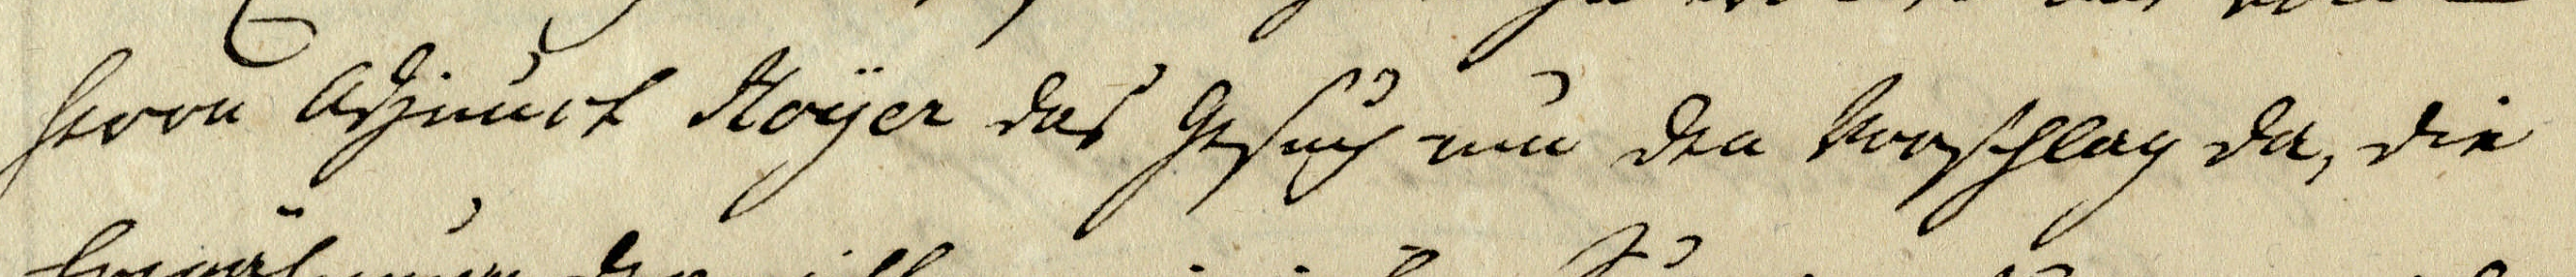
Herrn Adjunct Hoÿer das Gesuch um den Vorschlag da, die
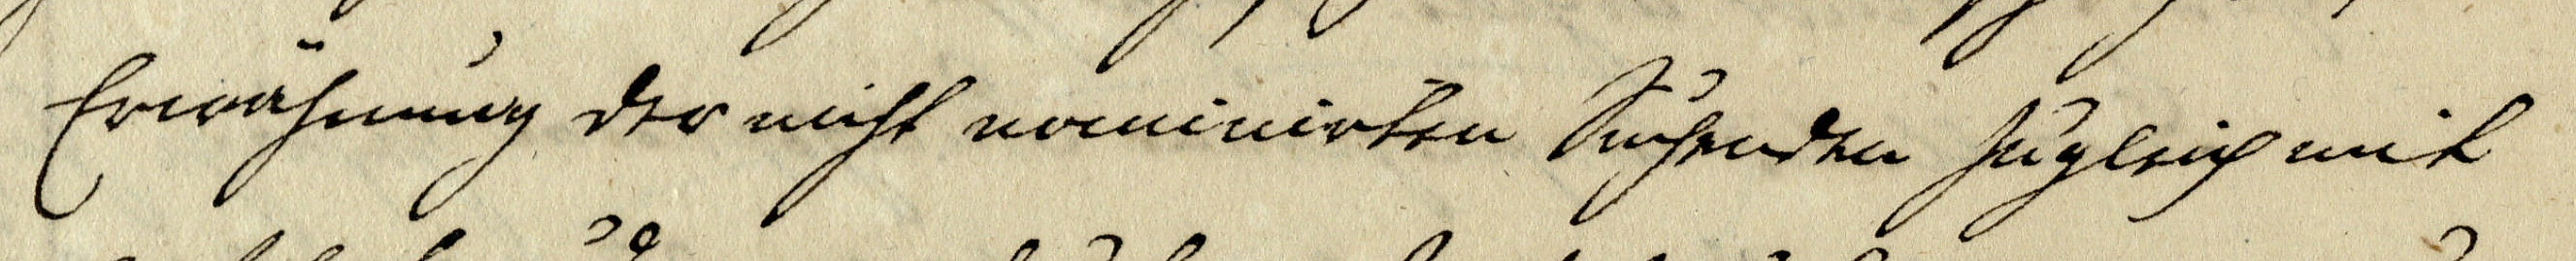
Erwähnung der nicht nominirten Suchenden zugleich mit
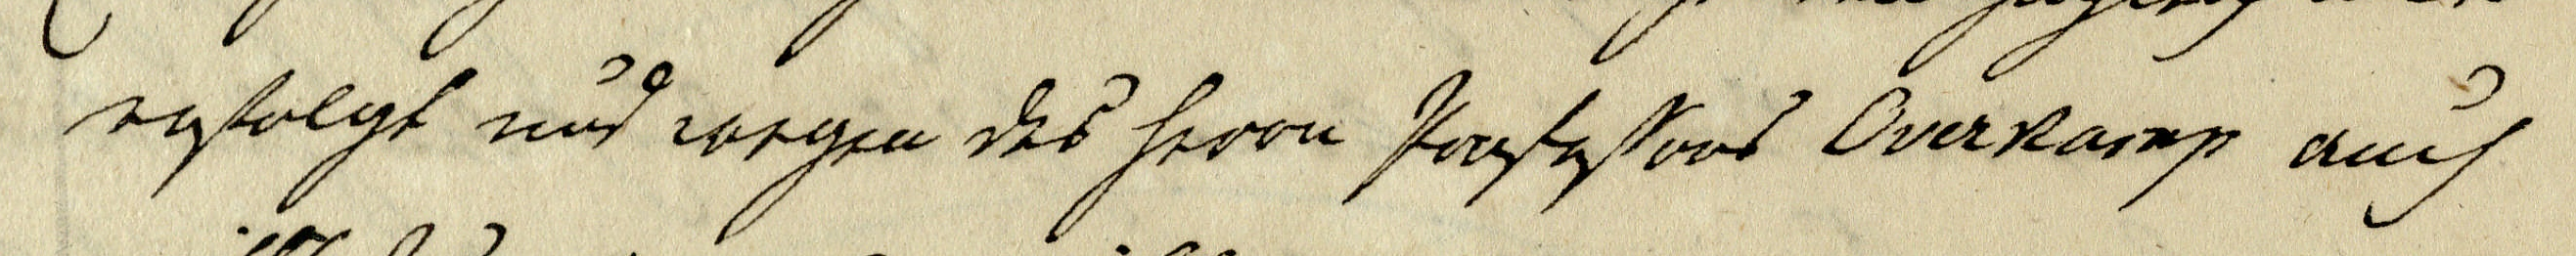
erfolgt und wegen des Herrn Professors Overkamp auch
